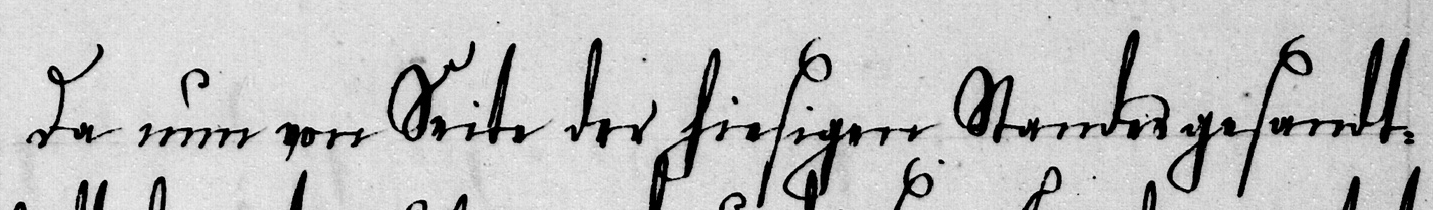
Da nun von Seite der hiesigen Standesgesandt¬
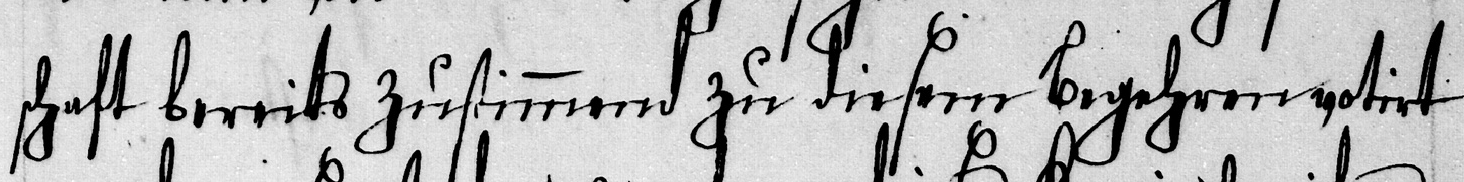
schaft bereits zustimmend zu diesem Begehren votirt
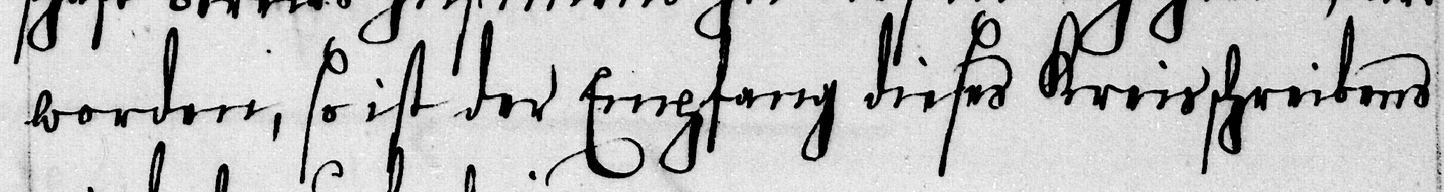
worden, so ist der Empfang dieses Kreisschreibens
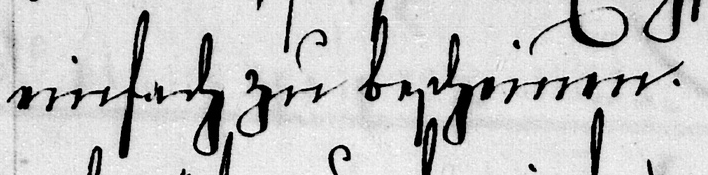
einfach zu bescheinen.
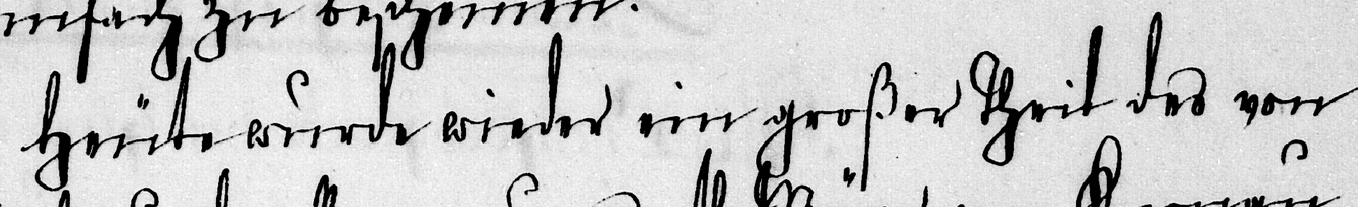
Heute wurde wieder ein grosser Theil des von
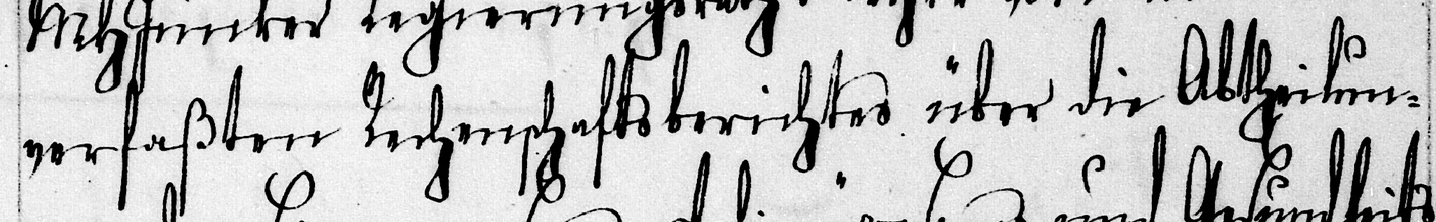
verfaßten Rechenschaftsberichtes über die Abtheilun¬
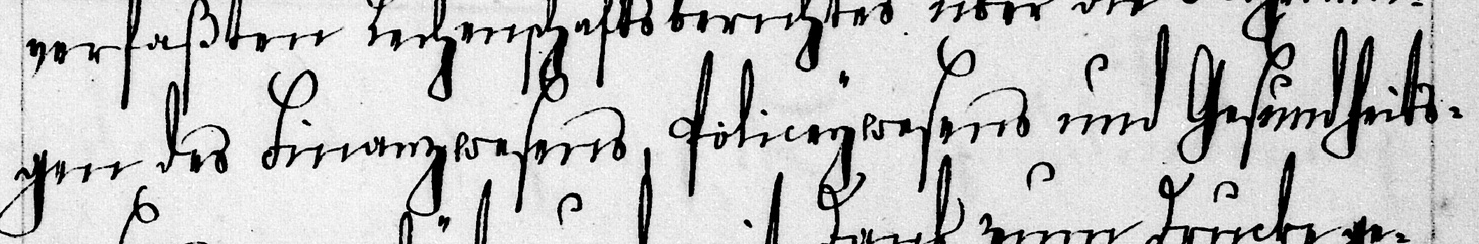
gen des Finanzwesens, Policeywesens und Gesundheits¬
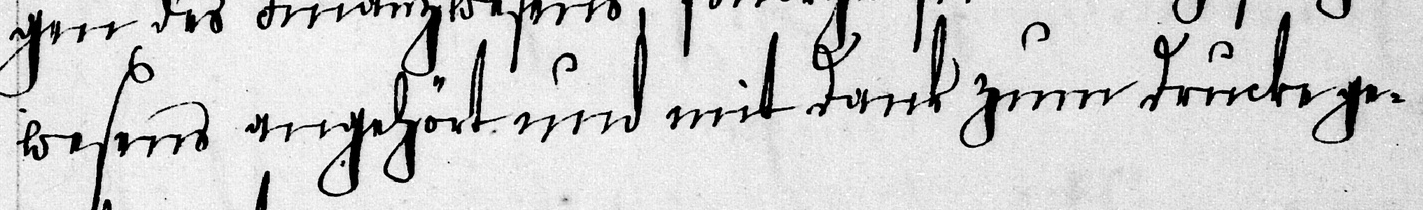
wesens angehört und mit Dank zum Drucke ge¬
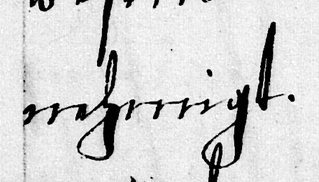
nehmigt.
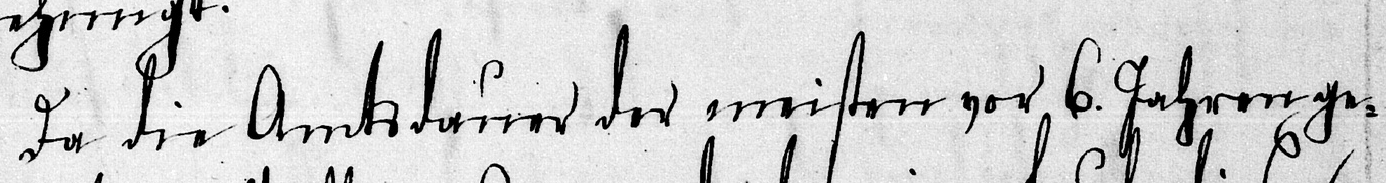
Da die Amtsdauer der meisten vor 6. Jahren ge¬
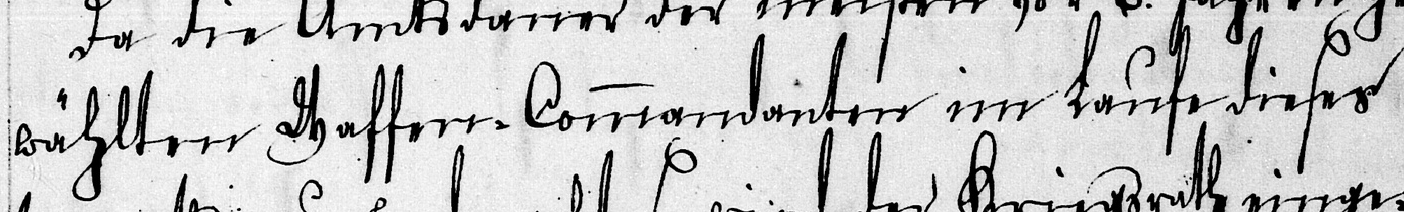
wählten Waffen-Commandanten im Laufe dieses
